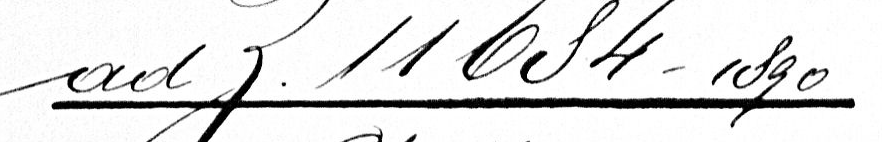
ad. Z. 11684-1890
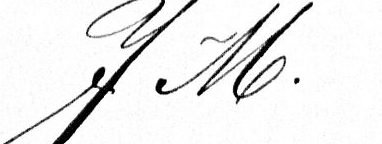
J M.
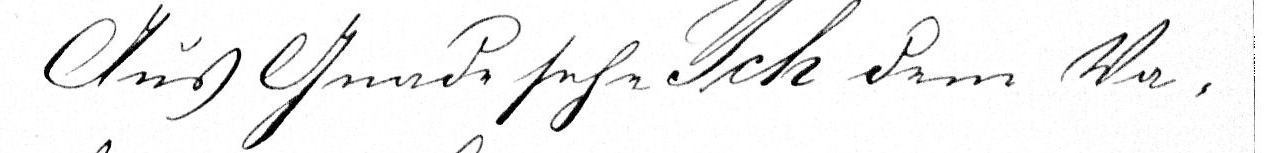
Aus Gnade sehe Ich dem Va¬
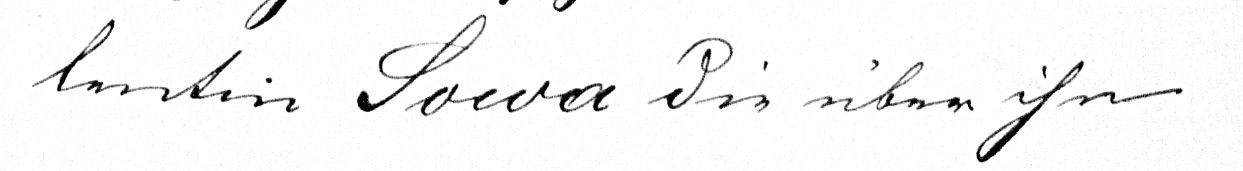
lentin Sowa die über ihn
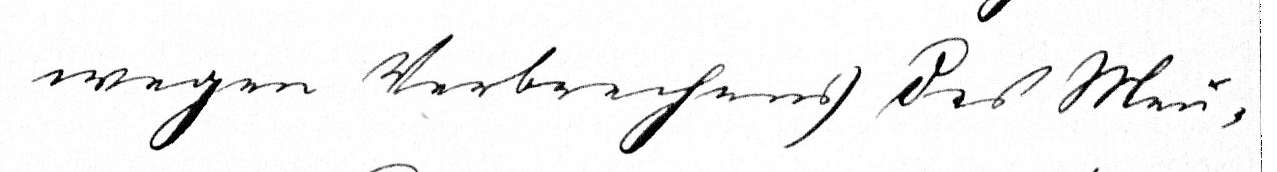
wegen Verbrechens des Meu¬
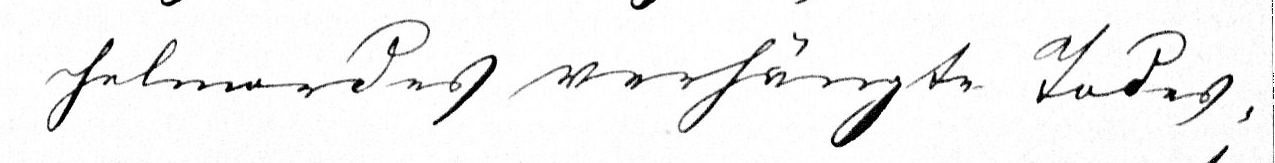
chelmordes verhängte Todes¬
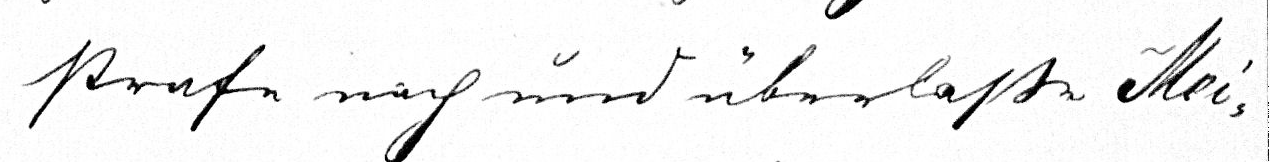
strafe nach und überlaße Mei¬
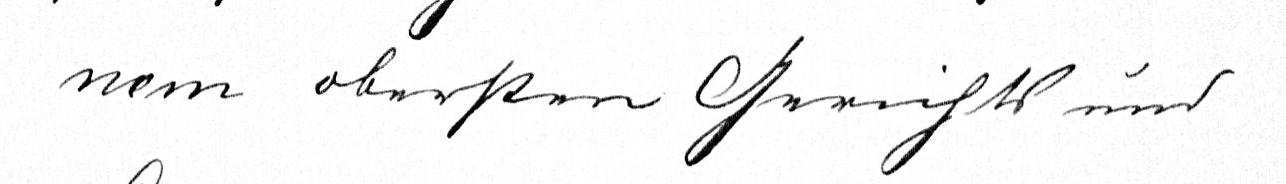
nem obersten Gerichts und
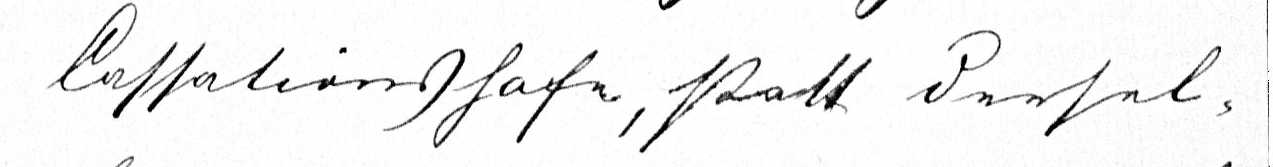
Cassationshofe, statt dersel¬
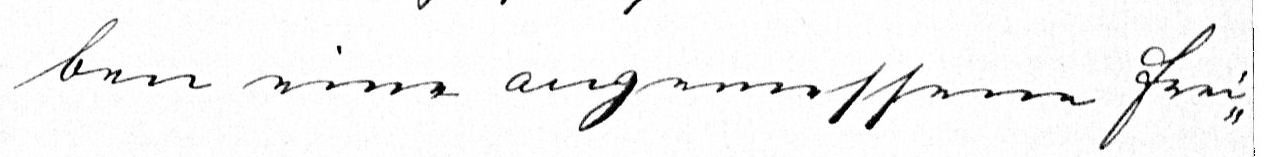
be4n eine angemessene Frei¬
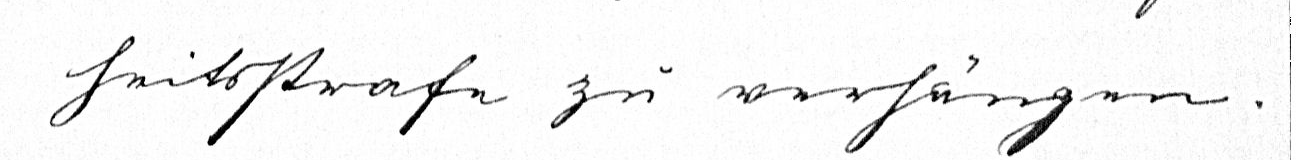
heitsstrafe zu verhängen.
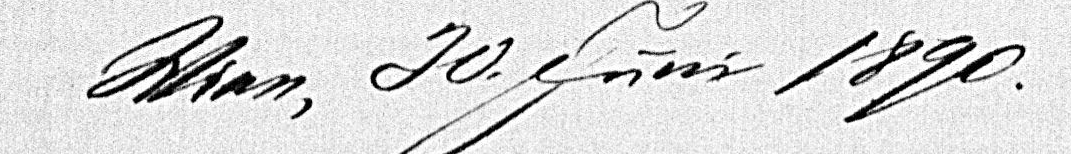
Wien, 20. Juni 1890.
